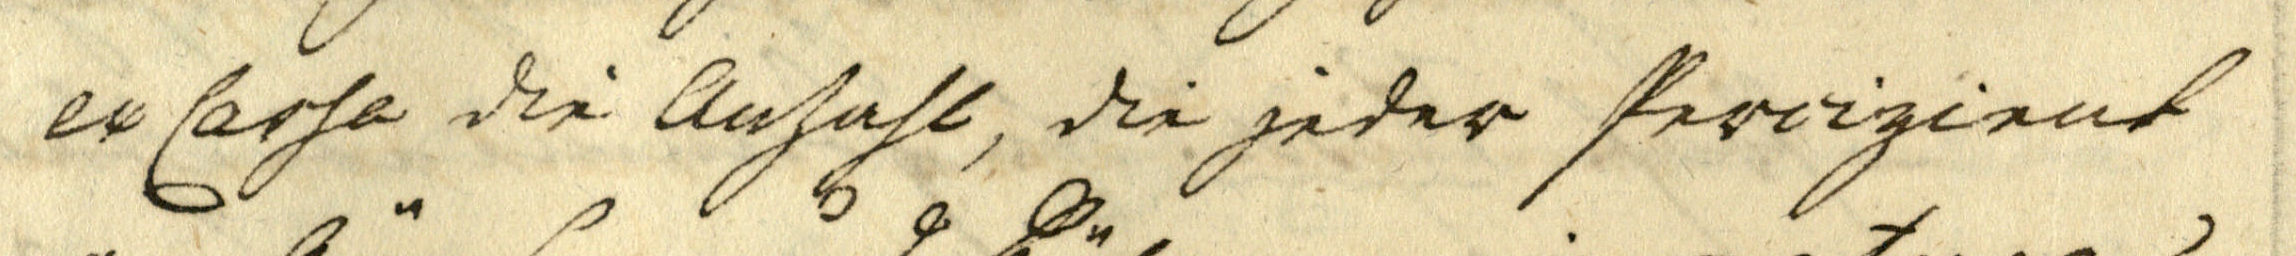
ex Cassa die Anzahl, die jeder Percipient
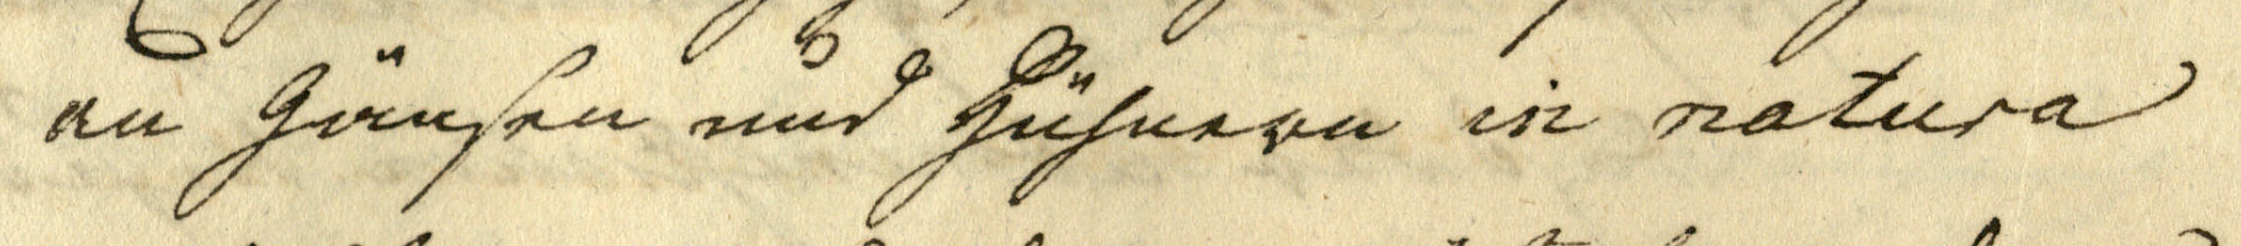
an Gänsen und Hühnern in natura
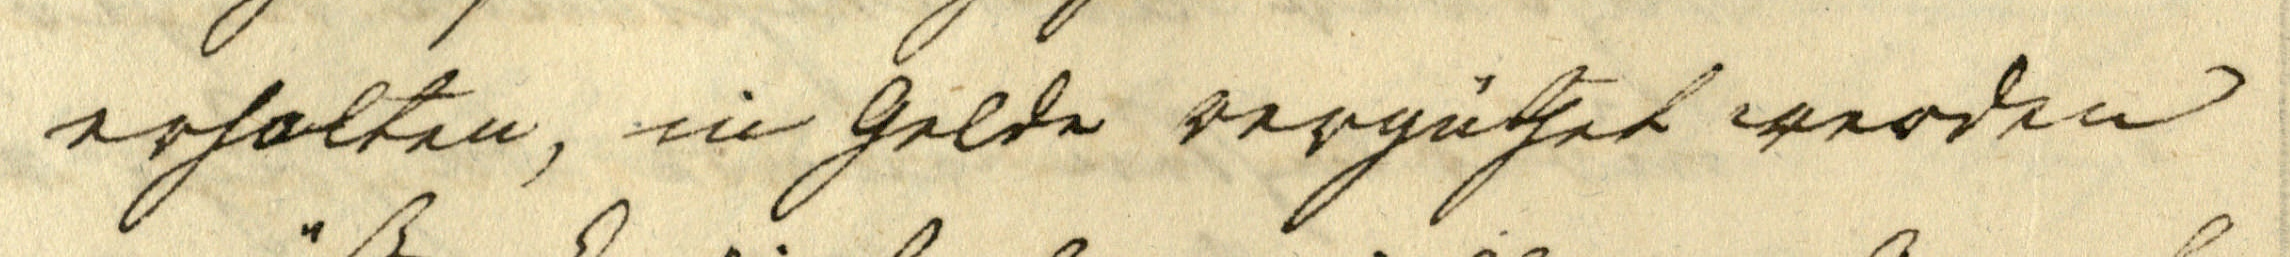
erhalten, in Gelde vergüthet werden
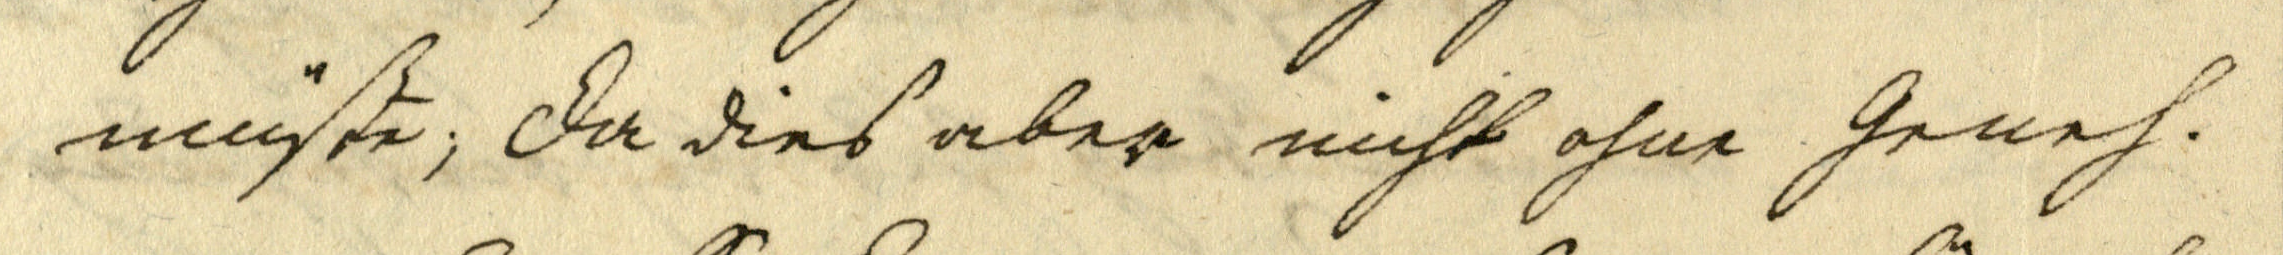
müßte; Da des aber nicht ohne Geneh¬
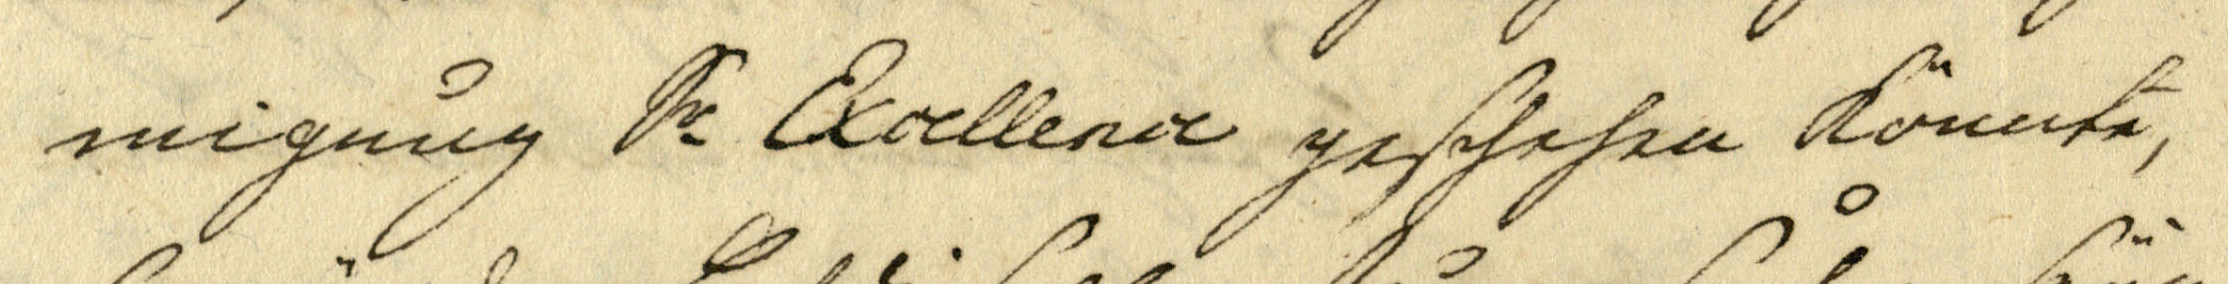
migung Sr Excellence geschehen könnte,
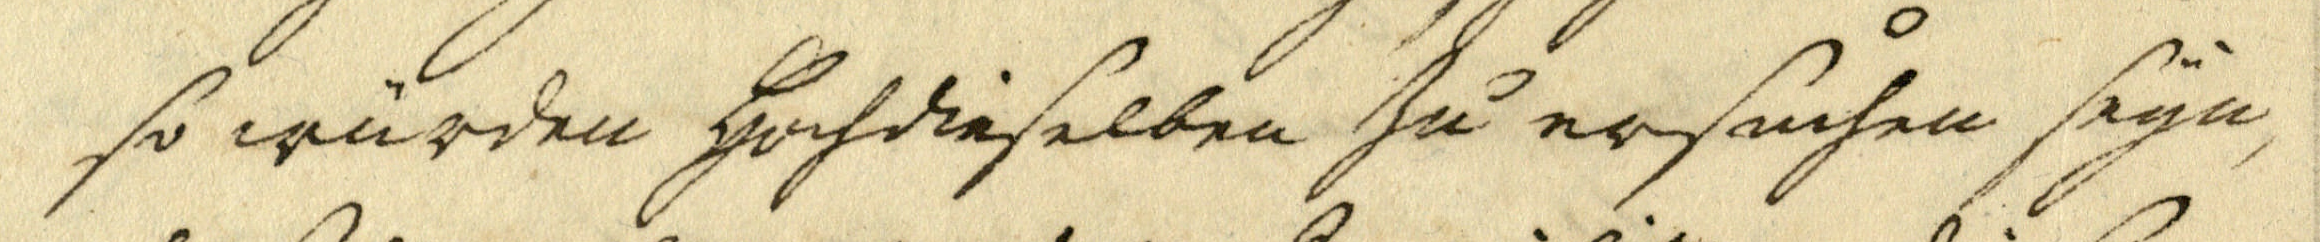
so würden Hochdieselben zu ersuchen seÿn,
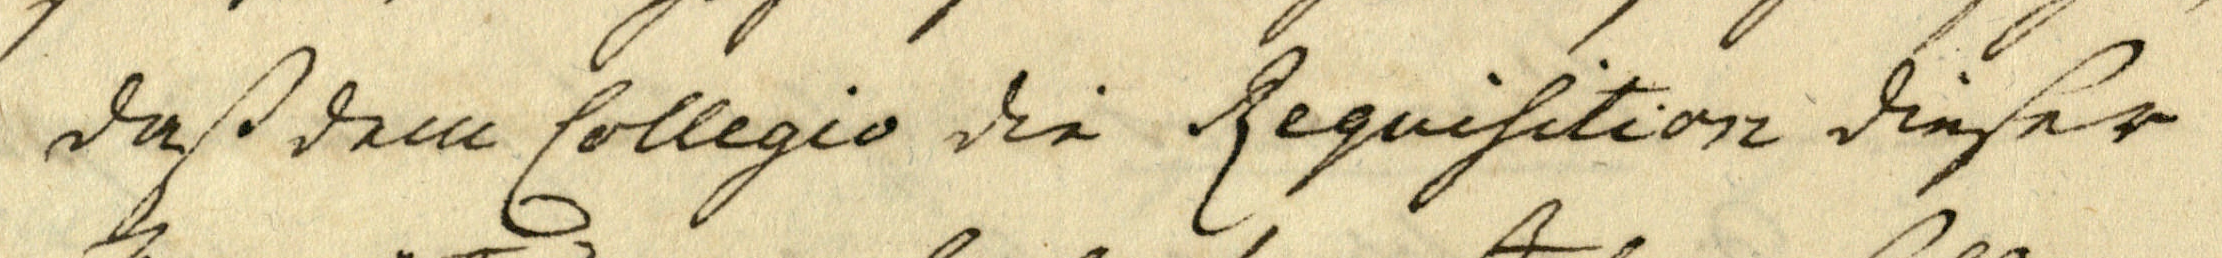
daß dem Collegio die Requisition dieser
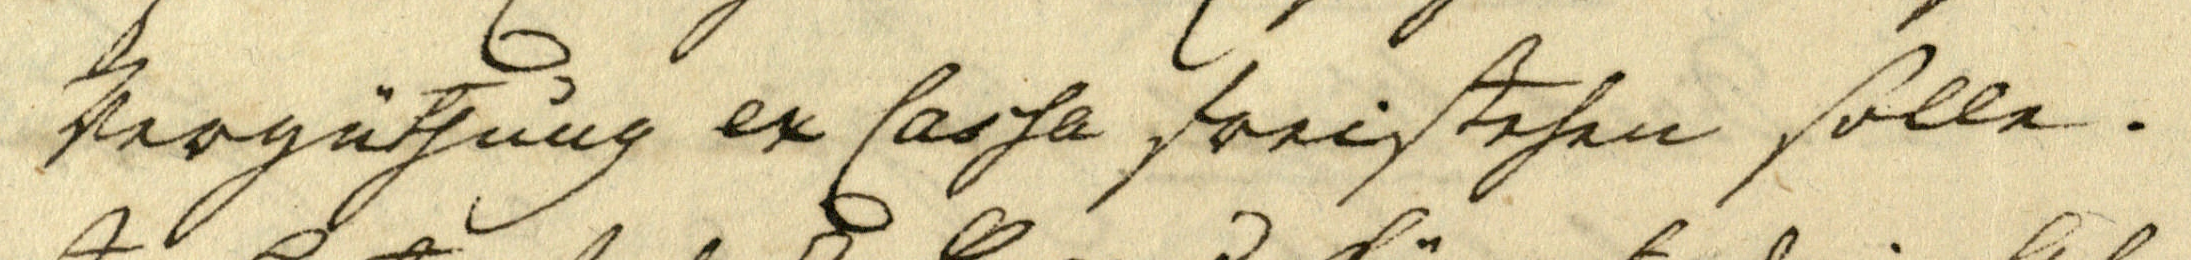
Vergüthung ex Cassa freistehen solle.
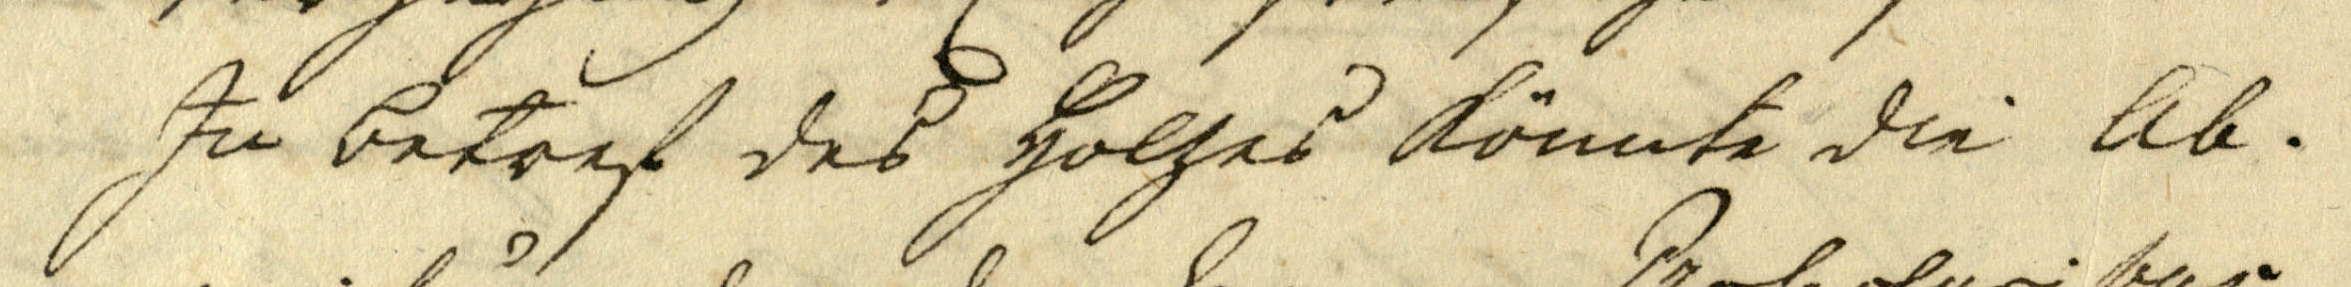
In Betref des Holzes könnte die Ab¬
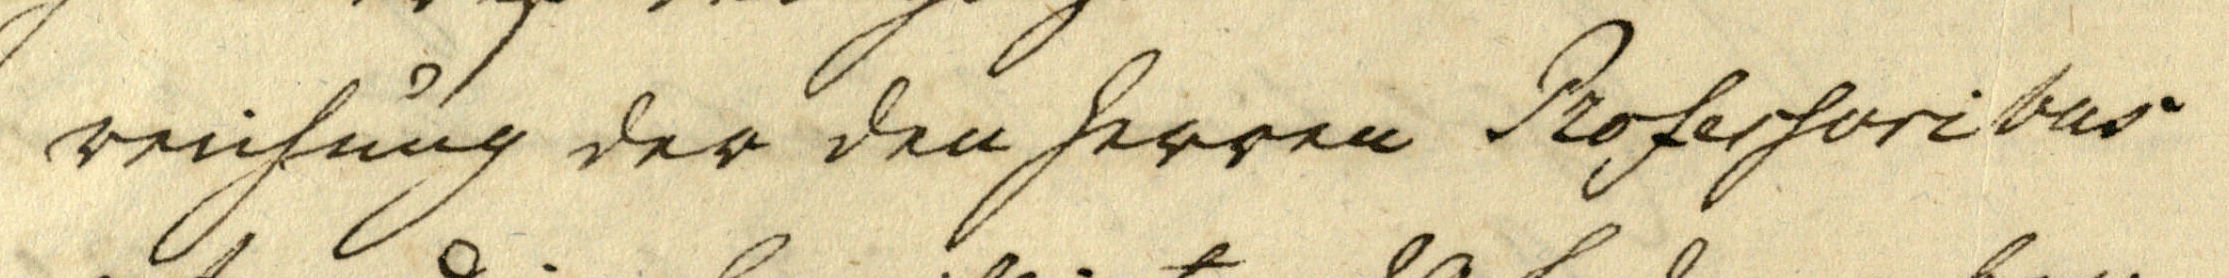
reichung der den Herren Professoribus
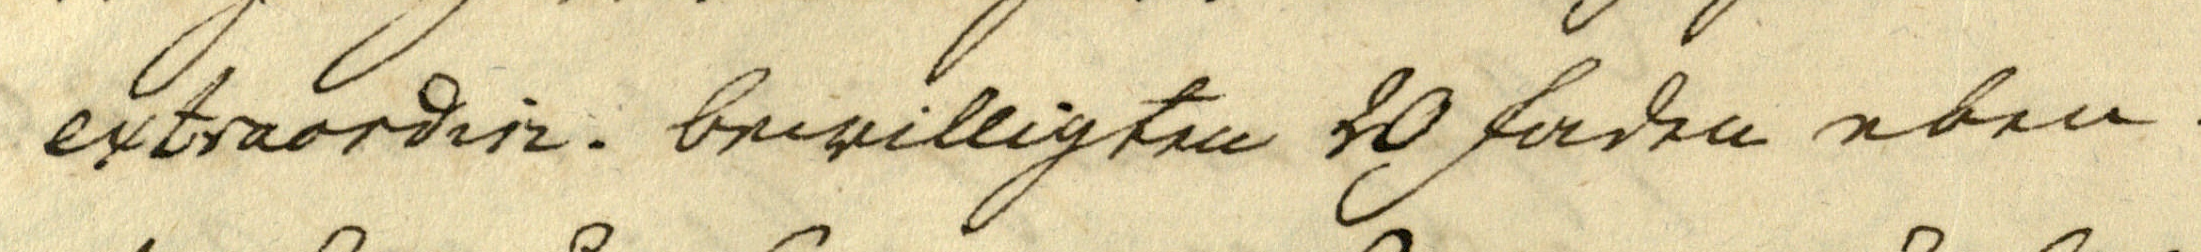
extraordin. bewilligten 20 Faden eben¬
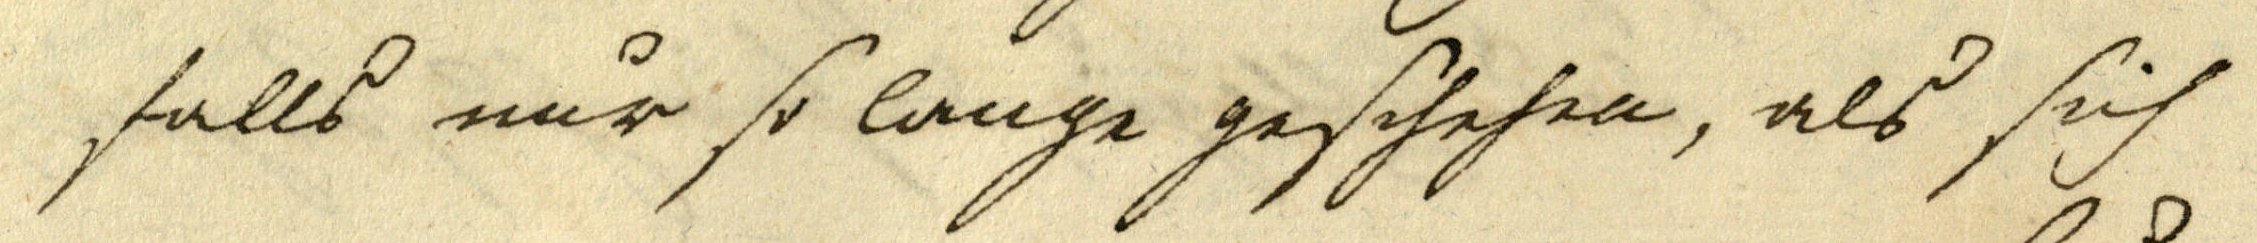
falls nur so lange geschehen, als sich
